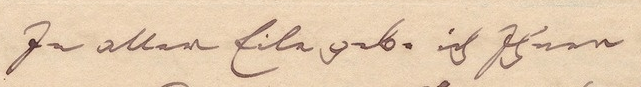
In aller Eile gebe ich Ihnen
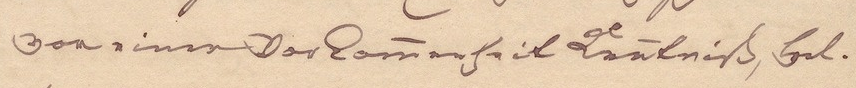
von einer Vorkommenheit Kenntniß, wel-
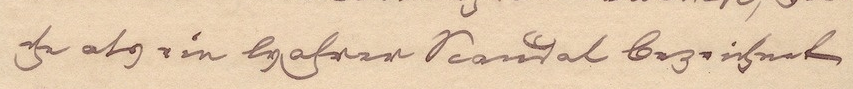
che als ein wahrer Scandal bezeichnet
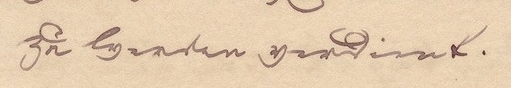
zu werden verdient.
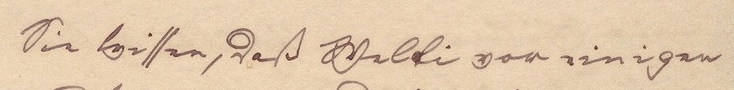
Sie wissen, daß Welti vor einigen
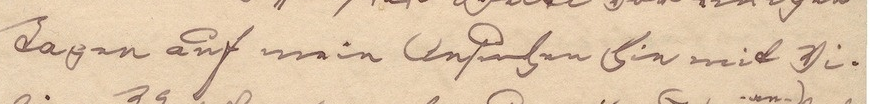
Tagen auf mein Ansuchen hin mit Vi-
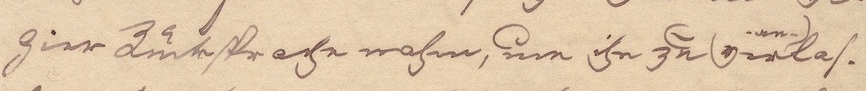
gier Rücksprache nahm, um ihn zu veranlas-
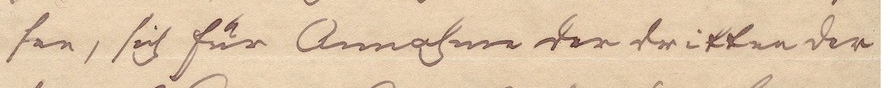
sen, sich für Annahme der dritten der
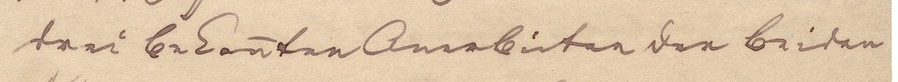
drei bekannten Anerbieten der beiden
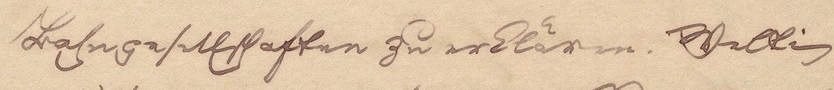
Bahngesellschaften zu erklären. Welti
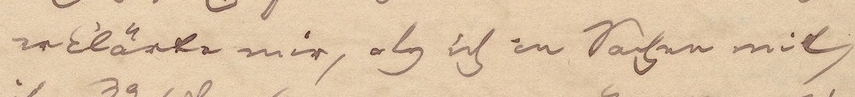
erklärte mir, als ich in Sachen mit
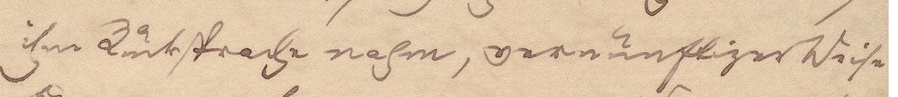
ihm Rücksprache nahm, vernünftiger Weise
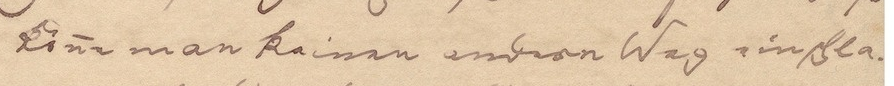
könne man keinen andern Weg einschla-
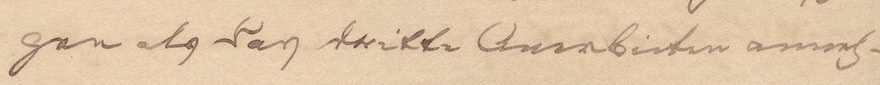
gen als das dritte Anerbieten anneh-
